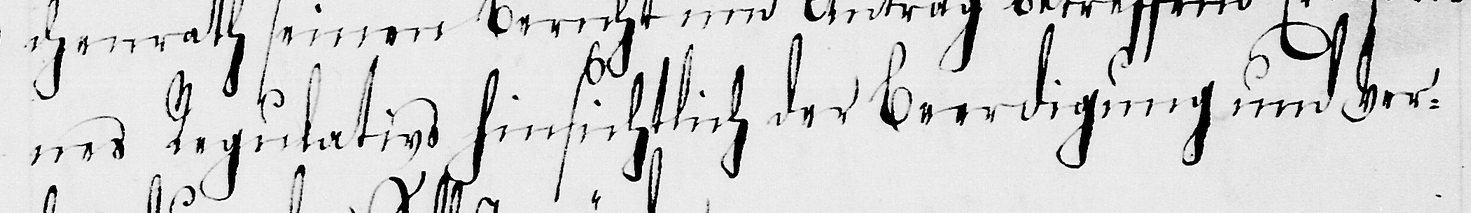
nes Regulativs hinsichtlich der Beerdigung und Ver¬
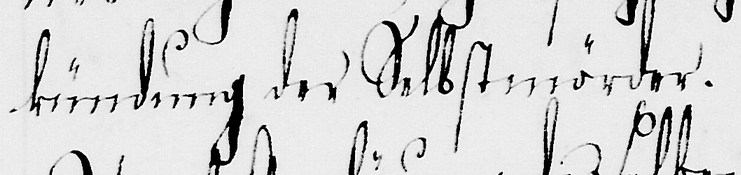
kündung der Selbstmörder.
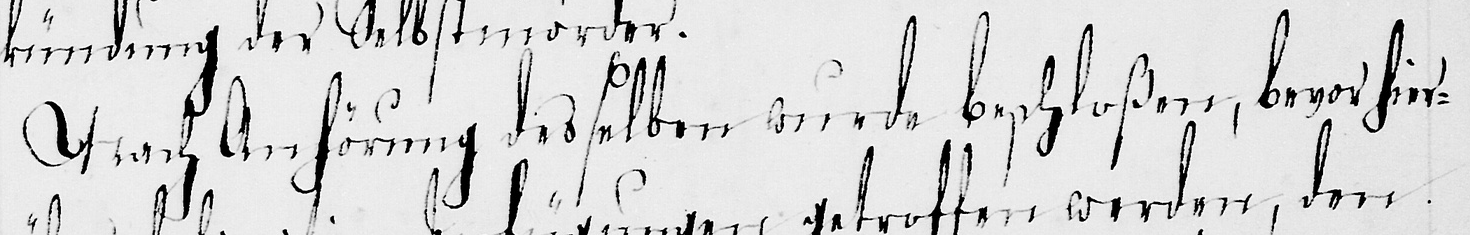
Nach Anhörung desselben wurde beschloßen, bevor hier¬
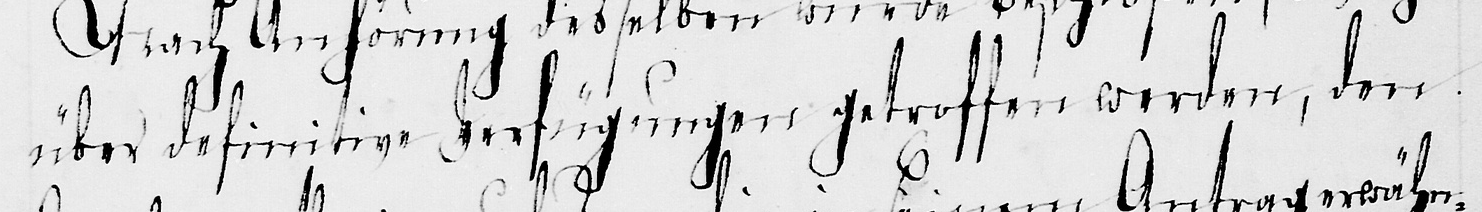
über definitive Verfügungen getroffen werden, den
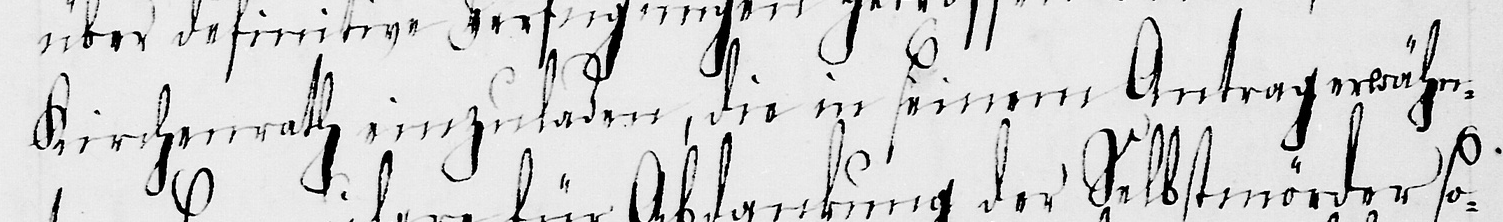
Kirchenrath einzuladen, die in seinem Antrag erwähn¬
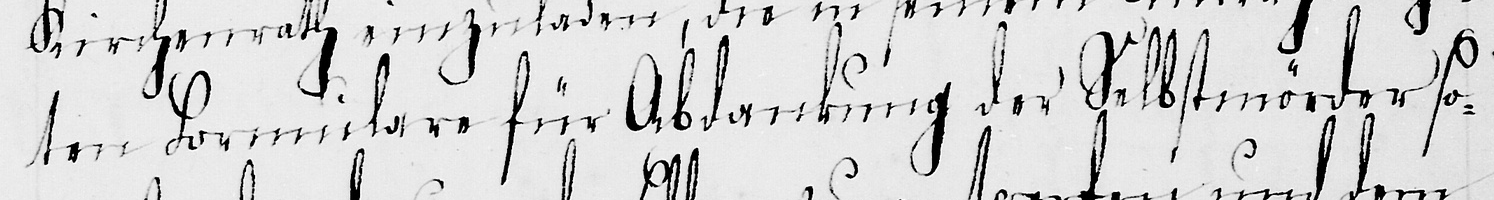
ten Formulare für Abdankung der Selbstmörder so¬
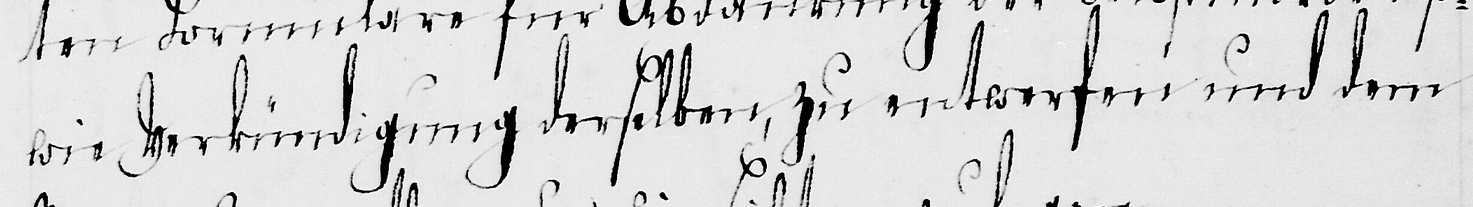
wie Verkündigung derselben, zu entwerfen und dem
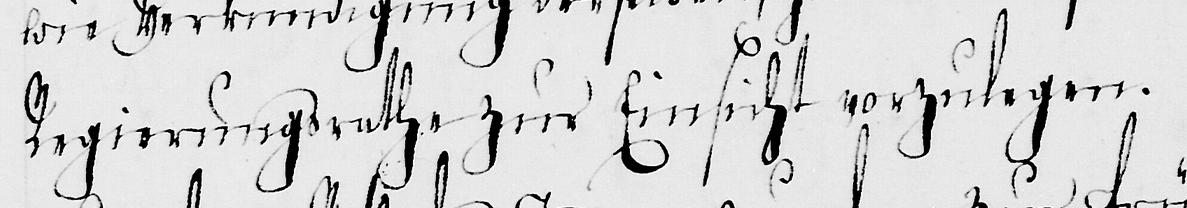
Regierungsrath zur Einsicht vorzulegen.
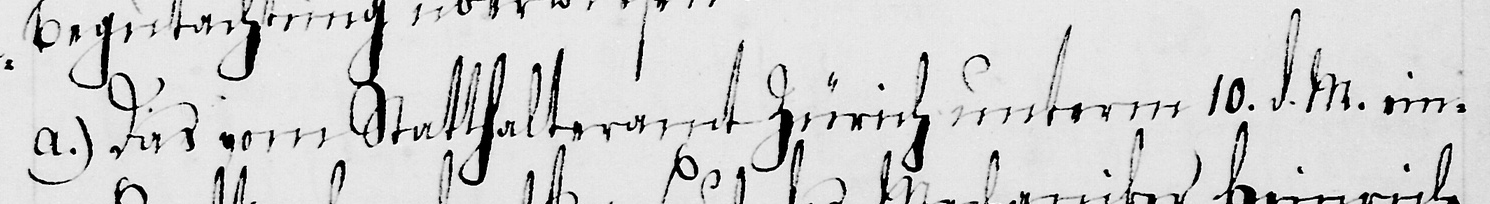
a.) Das vom Statthalteramt Zürich unterm 10. d. M. ein¬
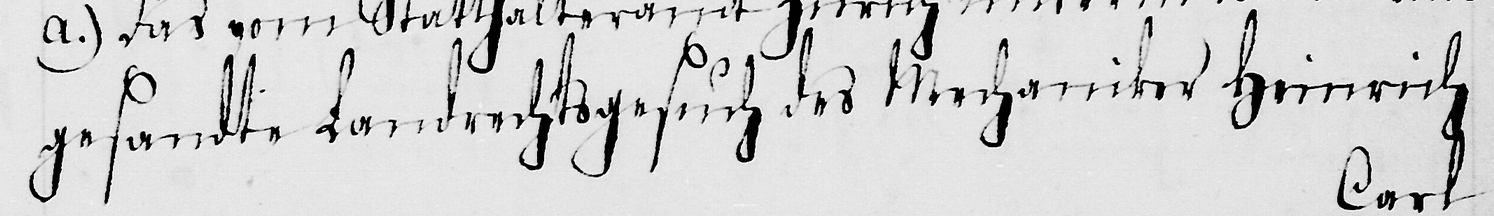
gesandte Landrechtsgesuch des Mechaniker Heinrich
